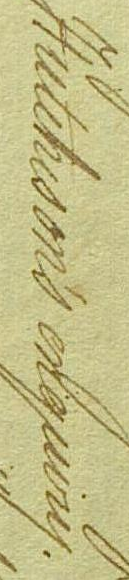Hutcheson's enquiry.
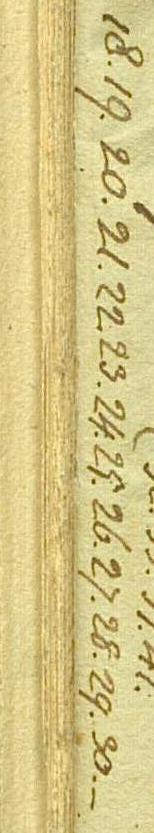18.19.20.21.22.23.24.25.26.27.28.29.30.
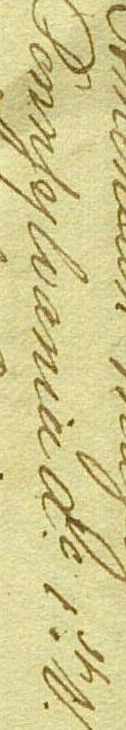Pennsylvania d^c 1^st V.
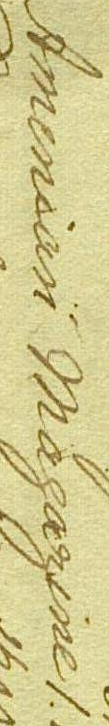American Magazine I.V.
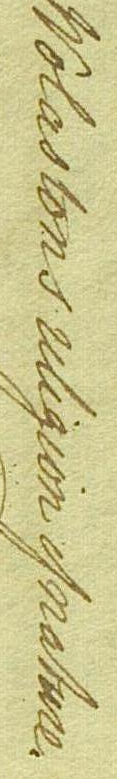Wolastons religion of nature.
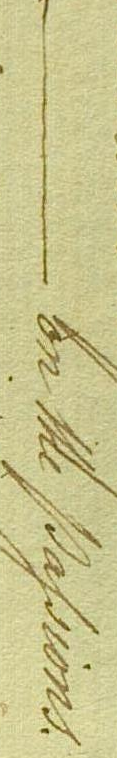––––– on the Passions
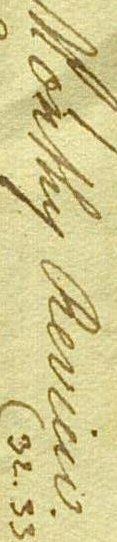Monthly Review.
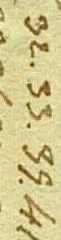32.33.39.41.
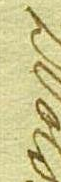2 Vols.
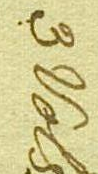3 Vols.
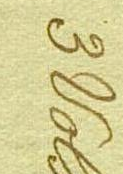3 Vols
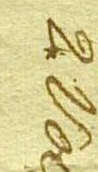2 Vols
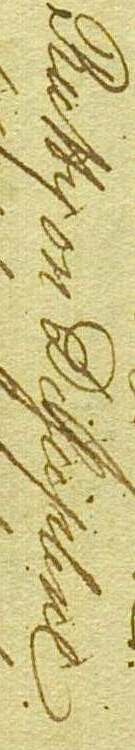Rutty on Discipline.
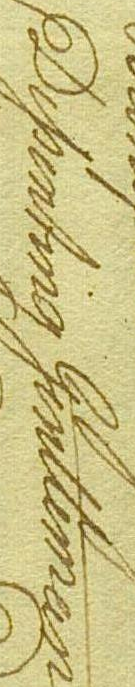Dissenting Gentleman.
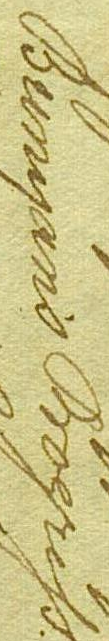Bunyan's Progress.
